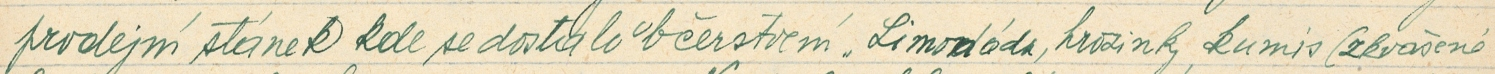prodejní stánek kde se dostalo občerstvení. Limonáda, hrozinky, kumis (zkvašené
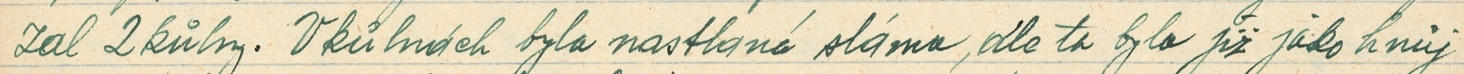zal 2 kůlny. V kůlnách byla nastlaná sláma, ale ta byla již jako hnůj,
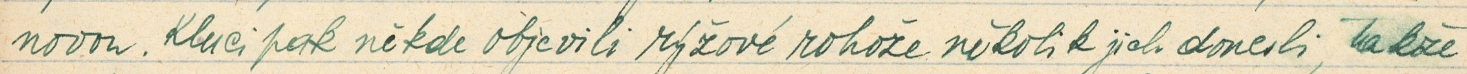novou. Kluci pak někde objevili rýžové rohože několik jich donesli, takže
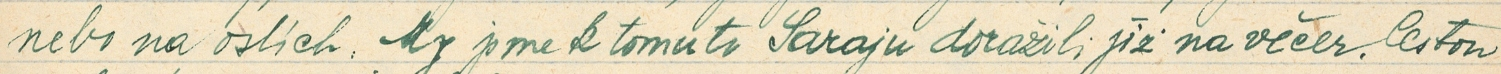nebo na oslích. My jsme k tomuto Saraju doražili již na večer. Cestou
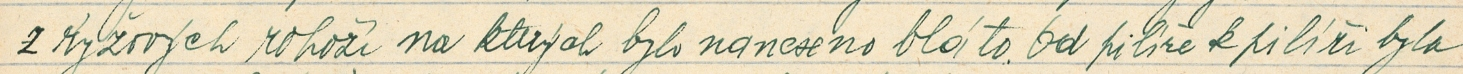z rýžových rohoží na kterých bylo naneseno bláto. Od pilíře k pilíři byla
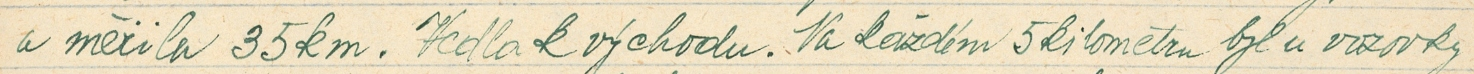a měřila 35 km. Vedla k východu. Na každém 5 kilometru byl u vozovky
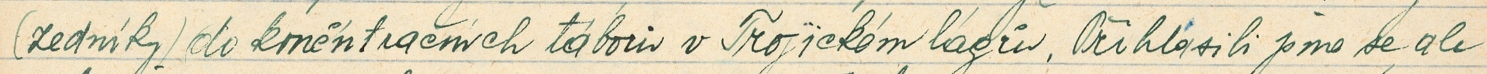(zedníky) do koncentračních táborů v Trojickém lágrů. Přihlásili jsme se, ale
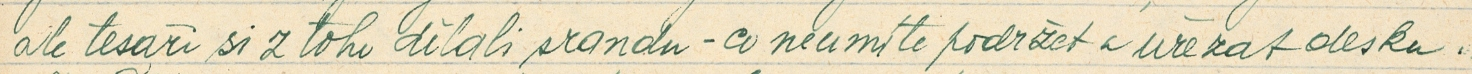ale tesaři si z toho dělali srandu - co neumíte podržet a uřezat desku.
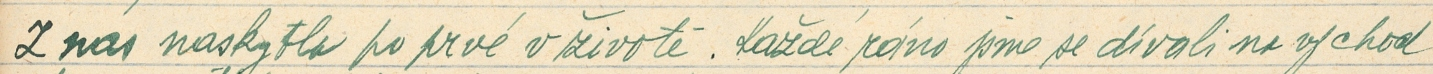z nás naskytla po prvé v životě. Každé ráno jsme se dívali na východ
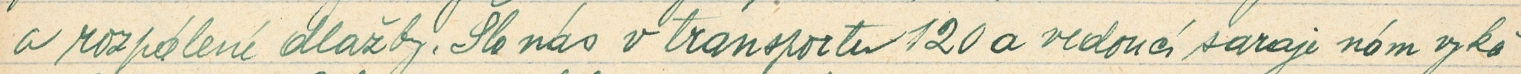a rozpálené dlažby. Šlo nás v transportu 120 a vedoucí saraje nám vyká
